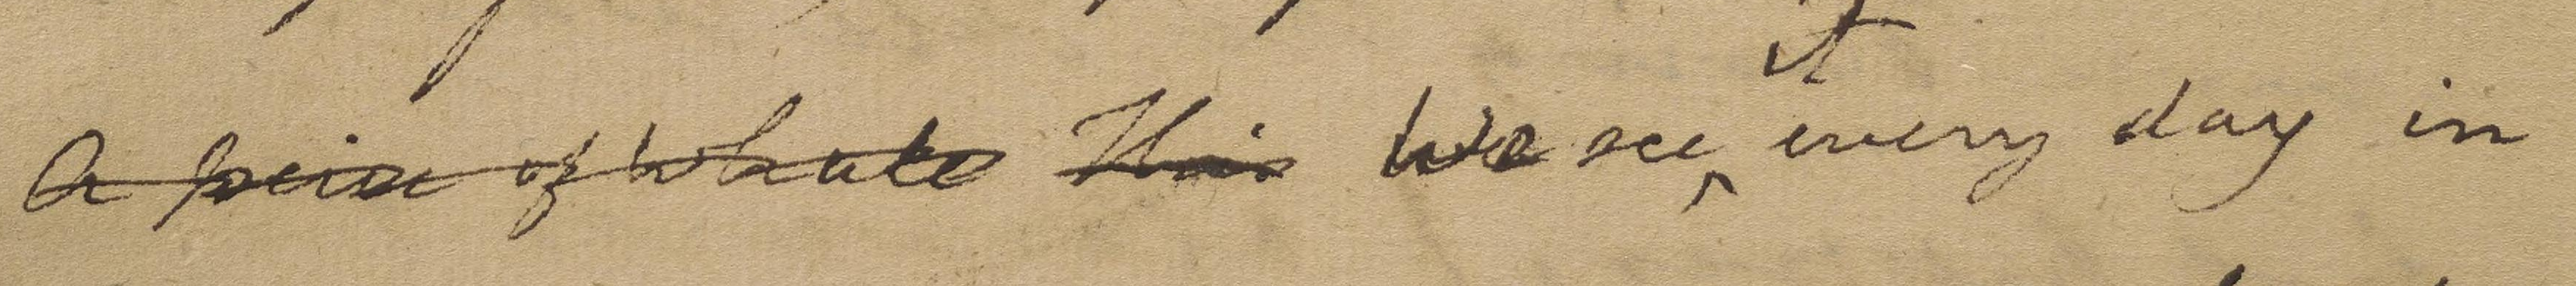[A peice of whale] [This] We see ^ every day in
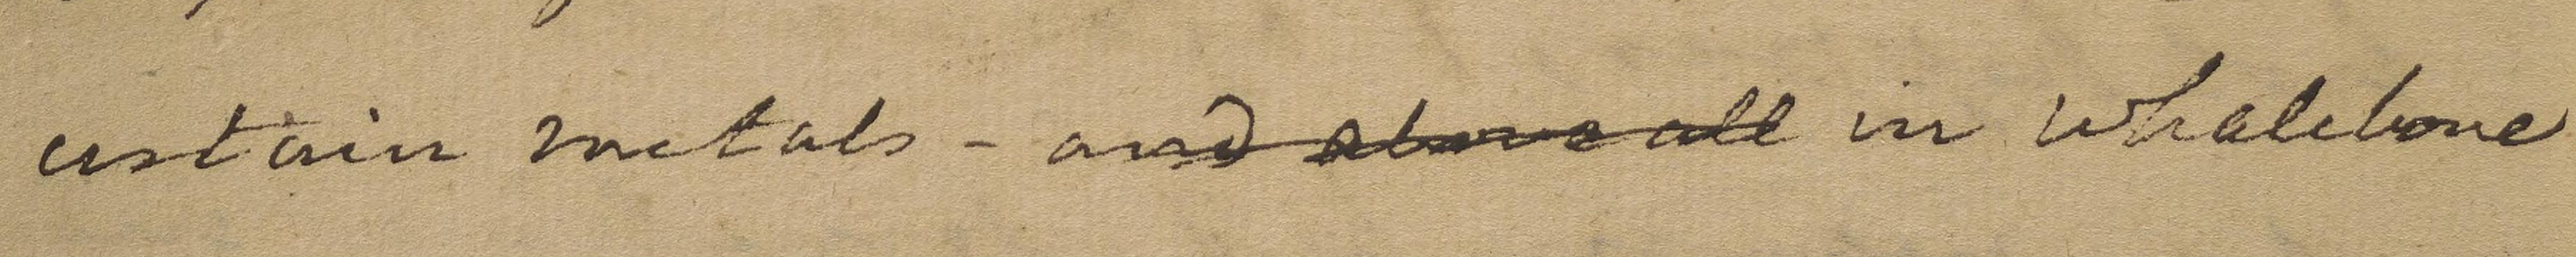certain metals and [above all] in whalebone
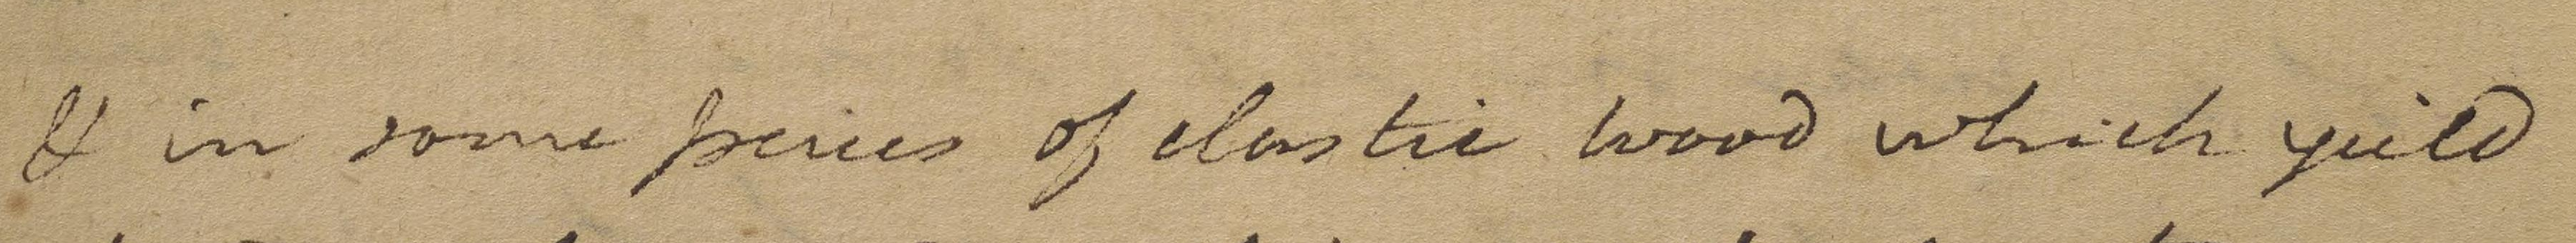& in some peices of elastic wood which yield
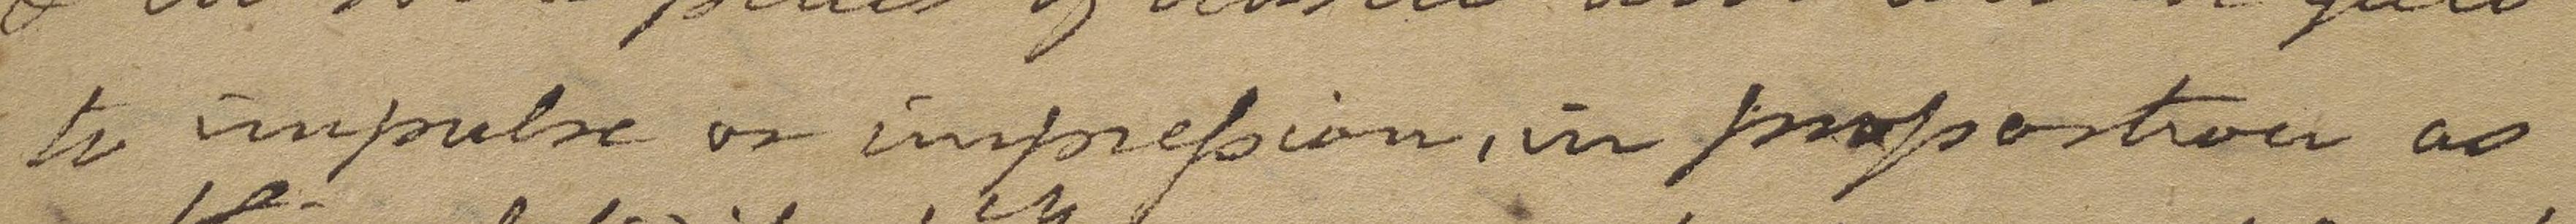to impulse or impression, in proportion as
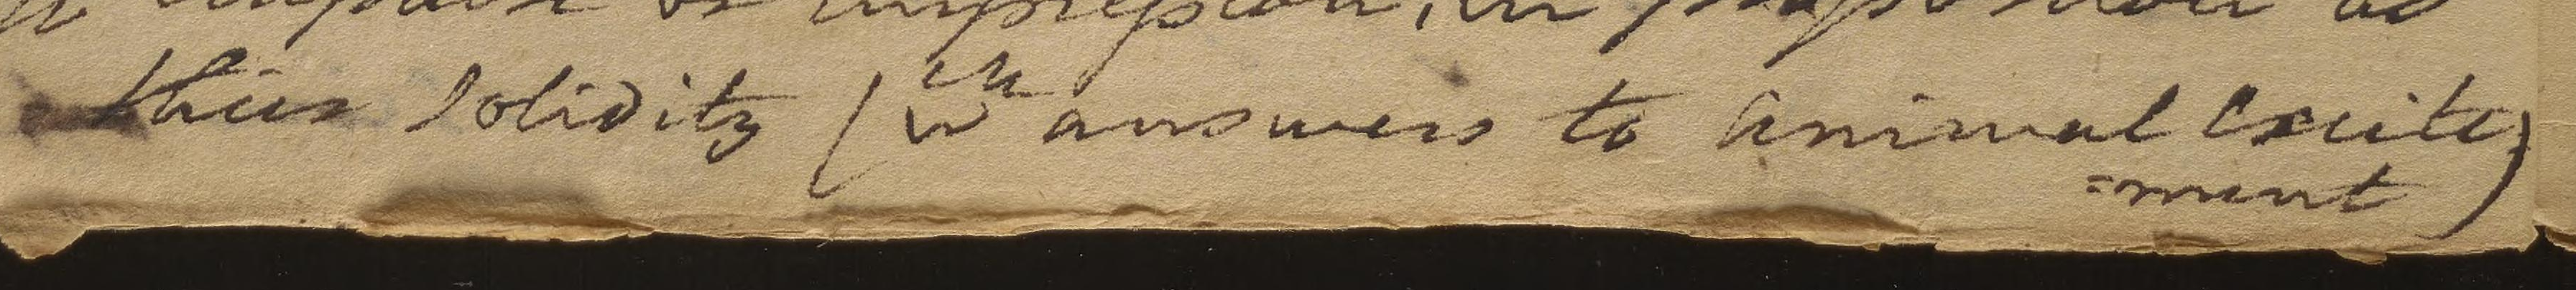this solidity (w^ch answers to animal excite-
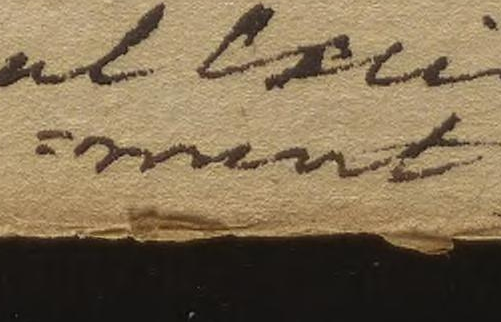-ment)
